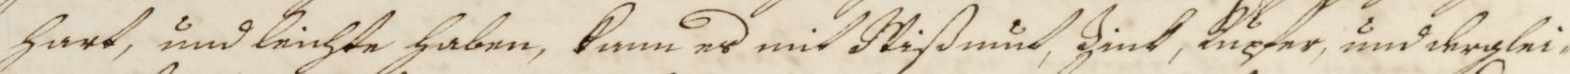hart, und leichte haben, kann es mit Wißmut, Zink, Kupfer, und derglei-
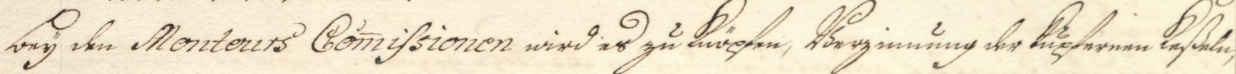Bey den Montours Commissionen wird es zu Knöpfen, Verzinnung der kupfernen Keßeln,
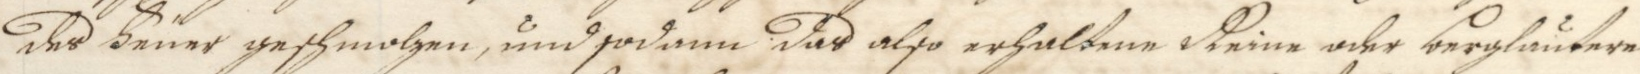des Feüer geschmolzen, und sodann das also erhaltene Reine oder Berglautere
